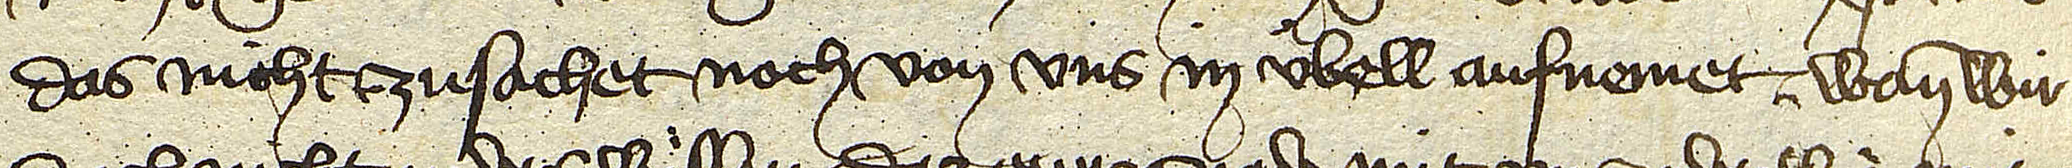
das nicht cʒuſachet noch von vns in v̈bell aufnemet / wan* wir
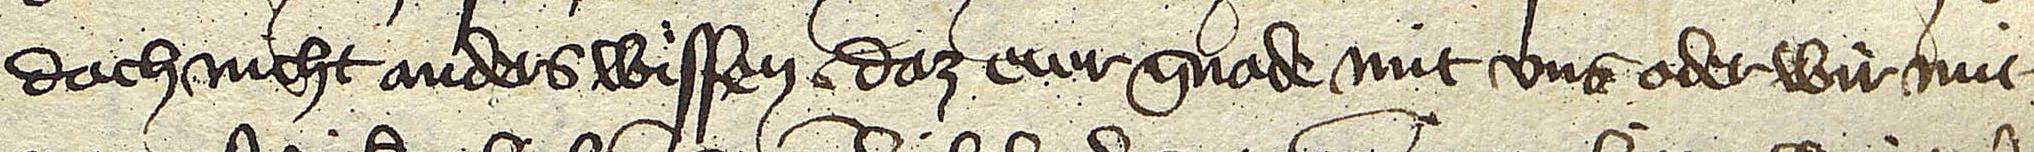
doch nicht anders wiſſen / daʒ ewr gnade mit vns oder wir mit
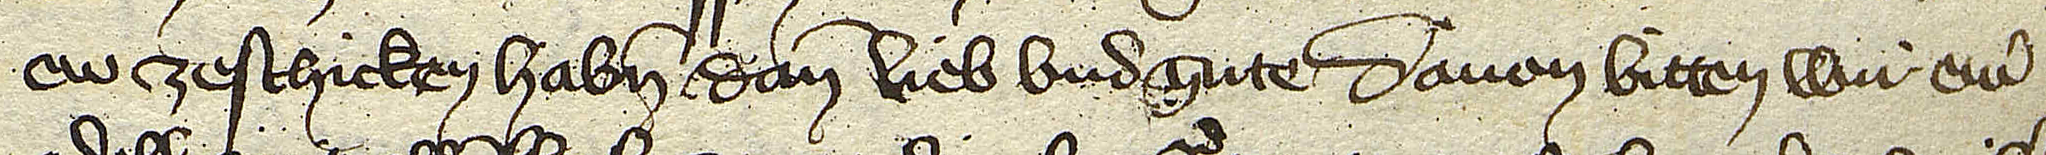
ew cʒeſchicken habn* / dan* lieb vnd gute / Dauon bitten wir ew*
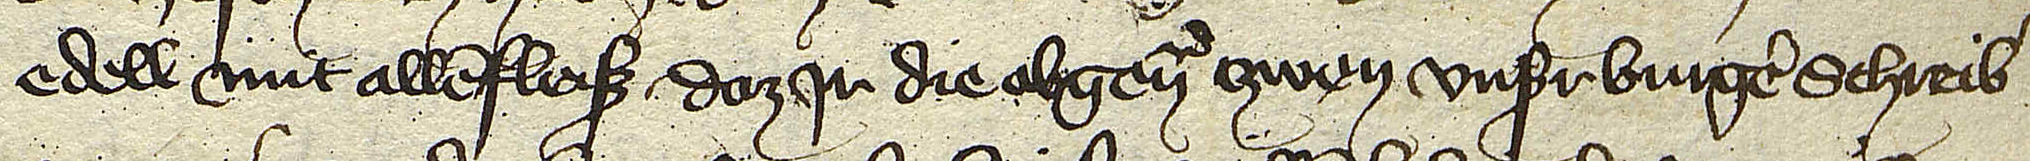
edell mit alle* fleiſʒ / daʒ Ir die obgen* cʒwen vnſ*r burge* Schreib*
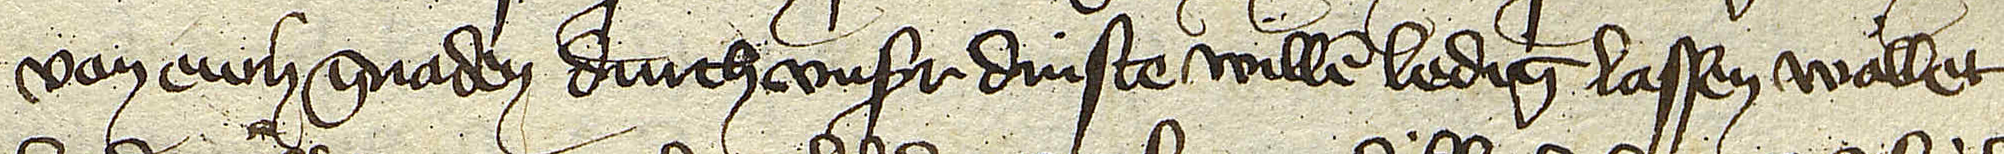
von ewr*n gnaden durch vnſ*r dinſte wille* ledig laſſen wöllet
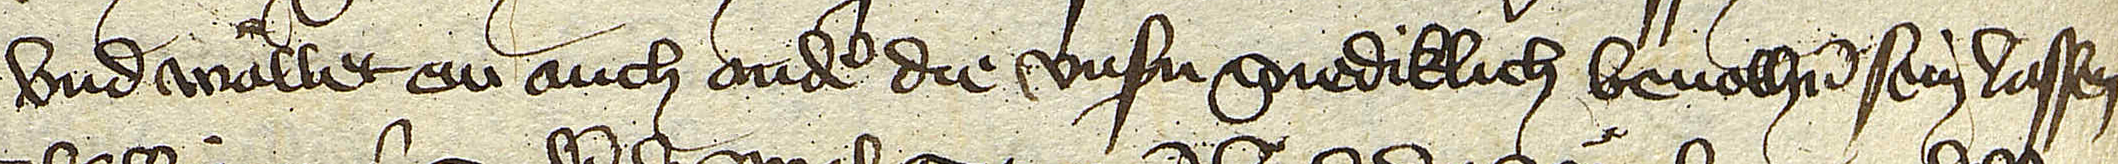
vnd wöllet ew auch ande* die vnſ*n gnediklich beuolhn* ſein laſſen
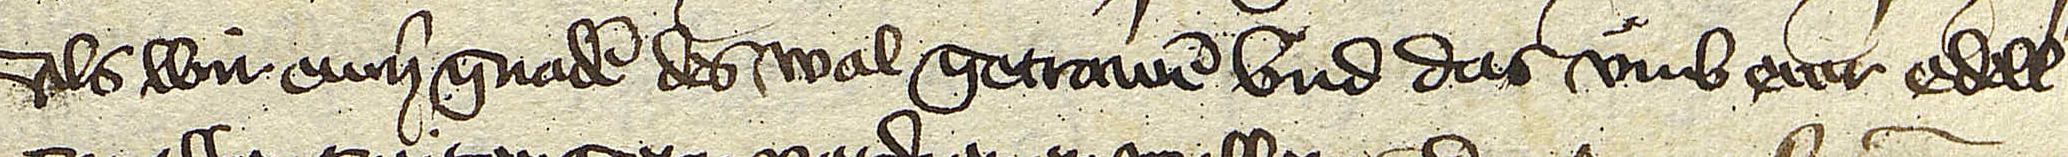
Als wir ewn* gnade* des wol getrawe* vnd das v̈mb ewr edell
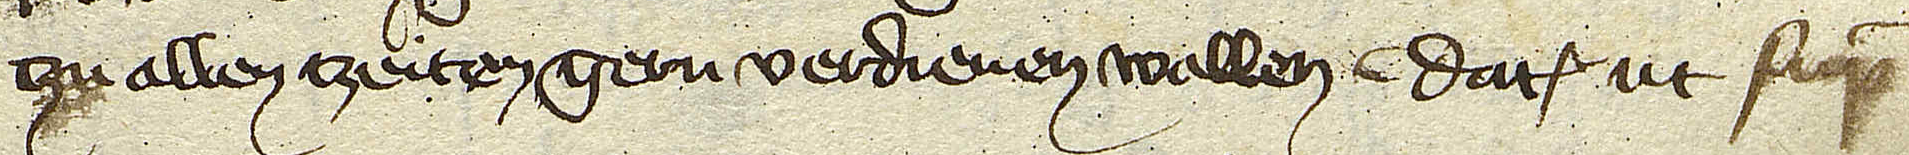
cʒu allen cʒeiten gern verdienen wollen / dat* ut ſup*
